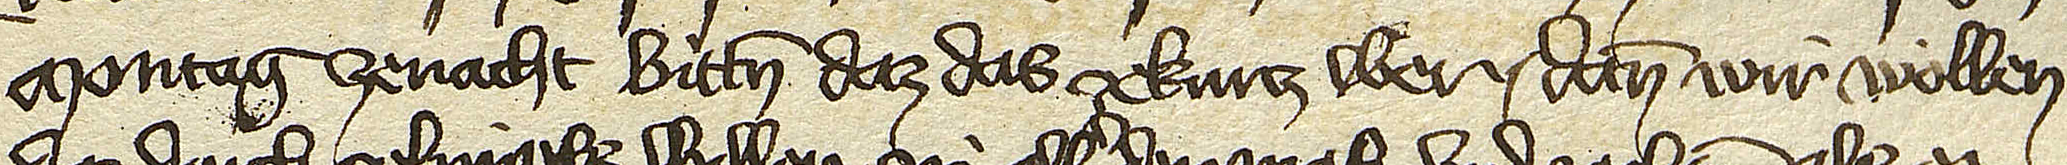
Montag cʒenacht bittn* daʒ das cʒekurcʒ wer / dan* wir wöllen
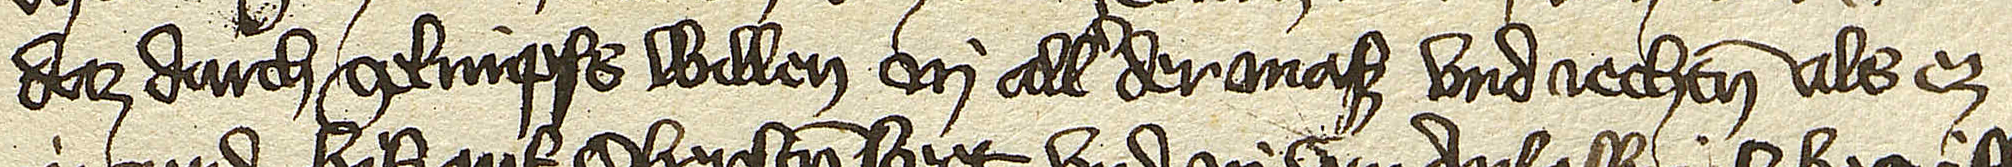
daʒ durch gelimpfs willen in all* der maſʒ vnd rechtn* als eʒ
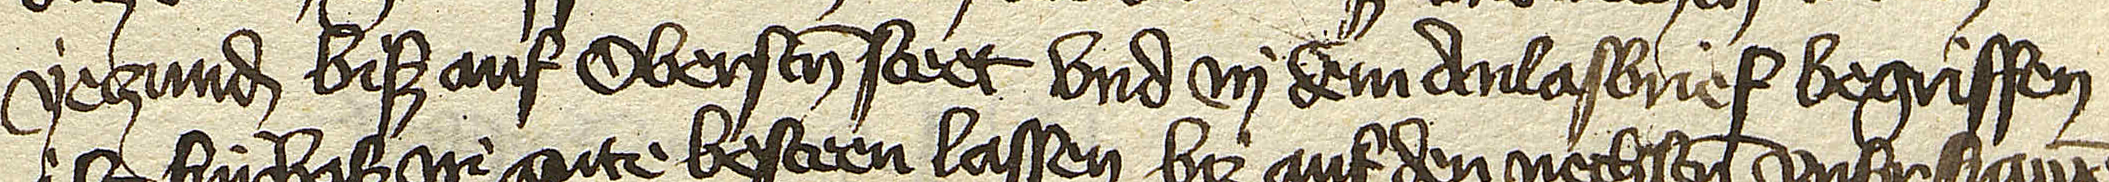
yecʒund* biſʒ auf Oberſtn* ſteet vnd in dem Anlaſbrief begriffen
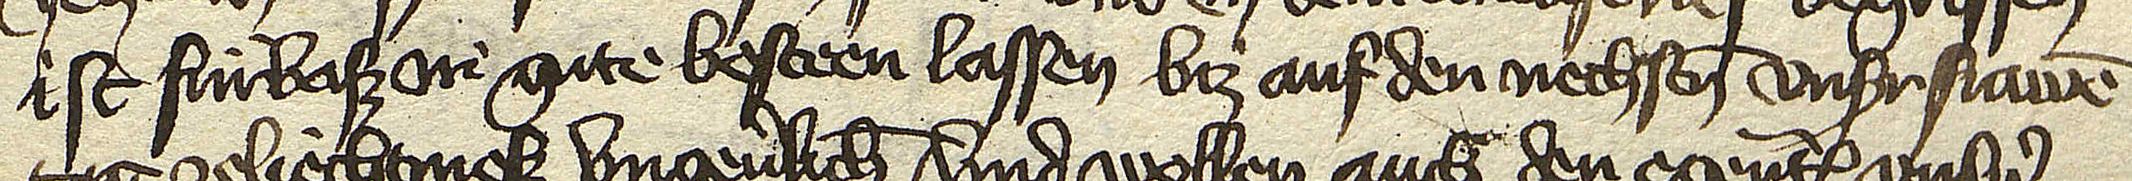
iſt fürbaſʒ in gute beſteen laſſen biʒ auf den nechſtn* vnſ*r frawe*
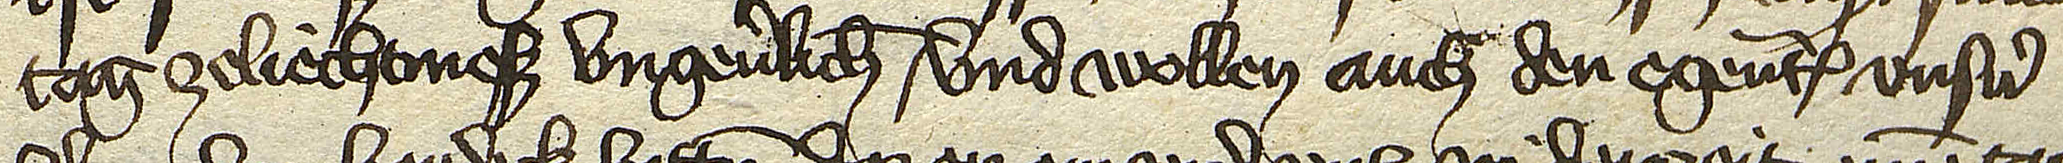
tag cʒeliechtmeſʒ vngeu*lich / vnd wollen auch den egent* vnſn*
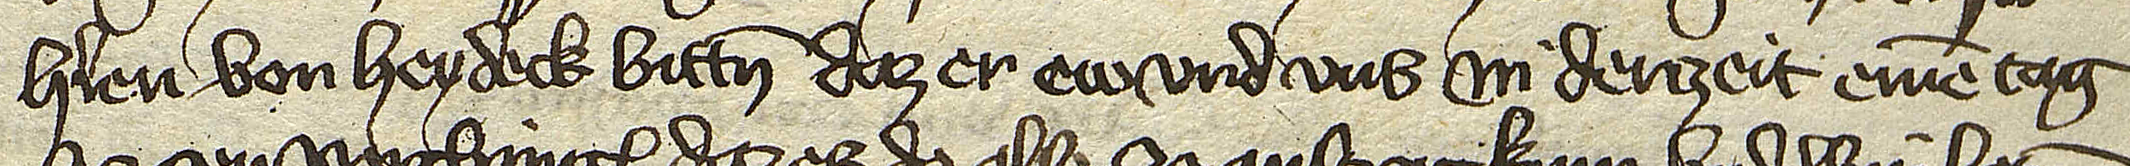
h*ren von heydeck bittn* daʒ er ew vnd vns in dercʒeit eine* tag
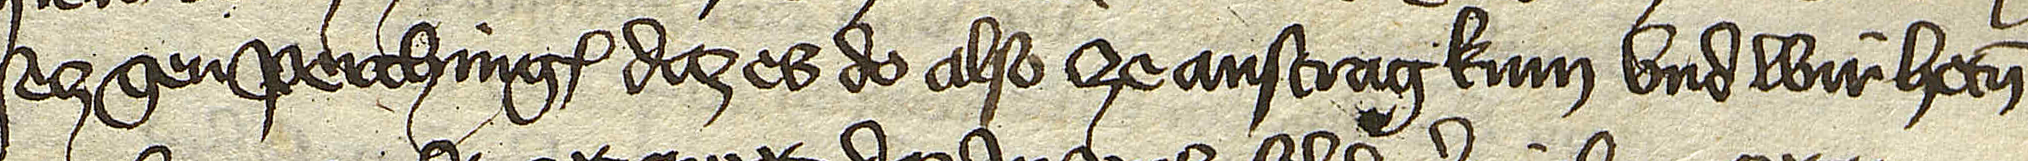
ſecʒ gen Perching* daʒ es do alſo auſtrag kun vnd wir hetn*
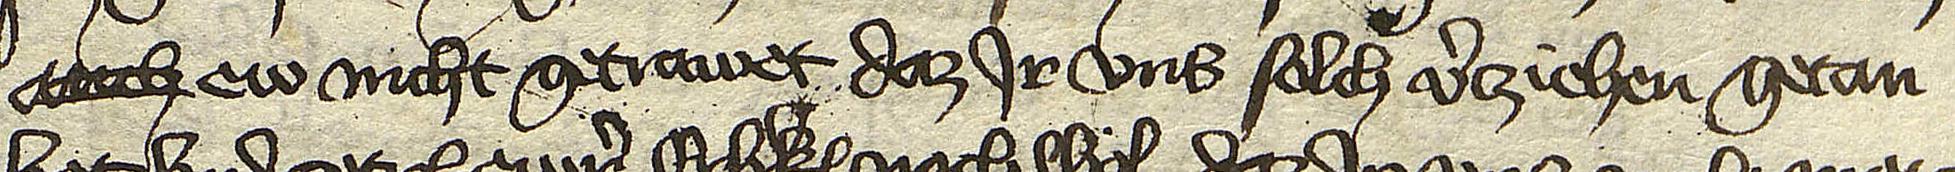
auch ew nicht getrawet daʒIr vns ſolch v*cʒiehen getan
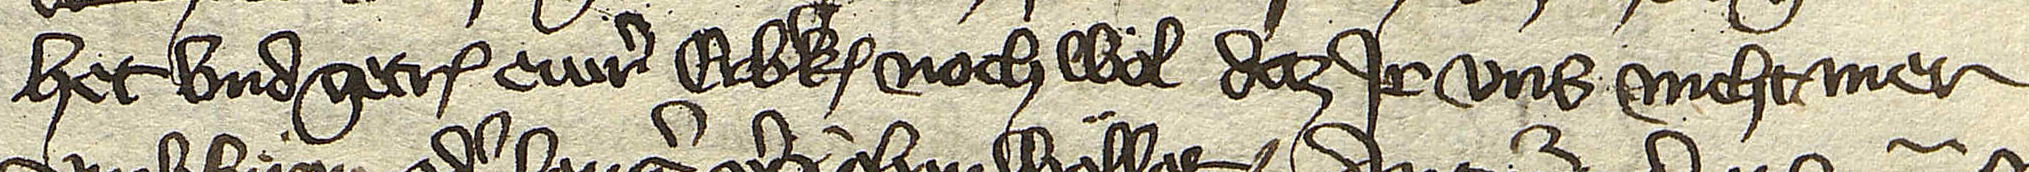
het vnd getr* ewr* Erb*k* noch wol daʒ Ir vns nicht mer
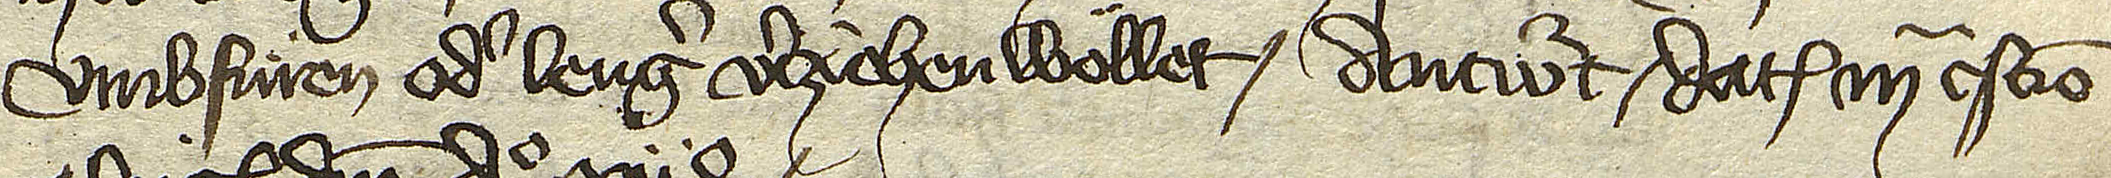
vmbfüren od* leng* v*cʒiehen wöllet / Antwt* / dat* in* cſtio*
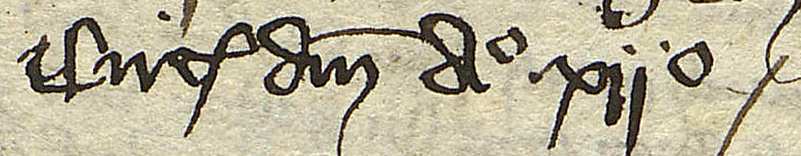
Cric* dni* A* xii* /
